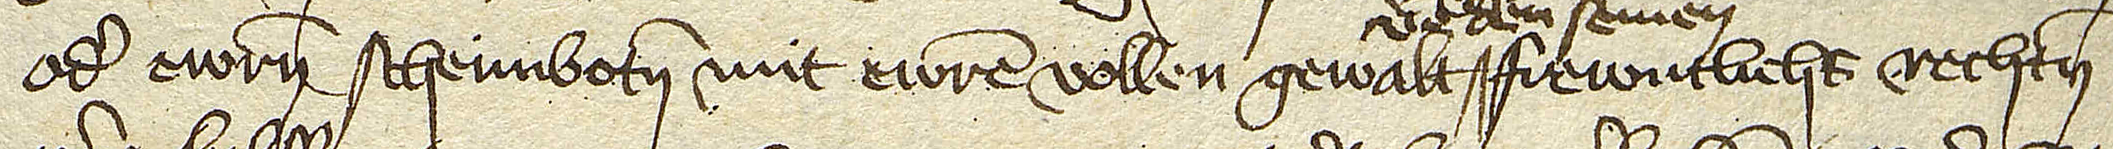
od* ewrn* ſcheimbotn* mit ewre* vollen gewalt frewntlichs rechtn*
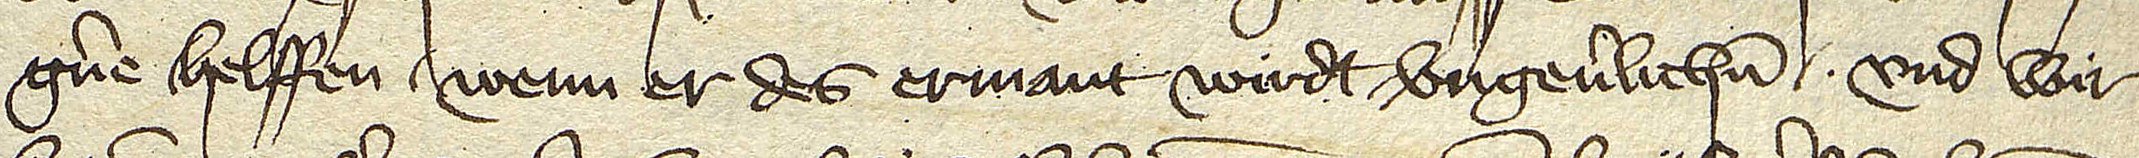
gne* helffen / wenn er des ermant wirdt / vngeu*lichn* / . vnd wir
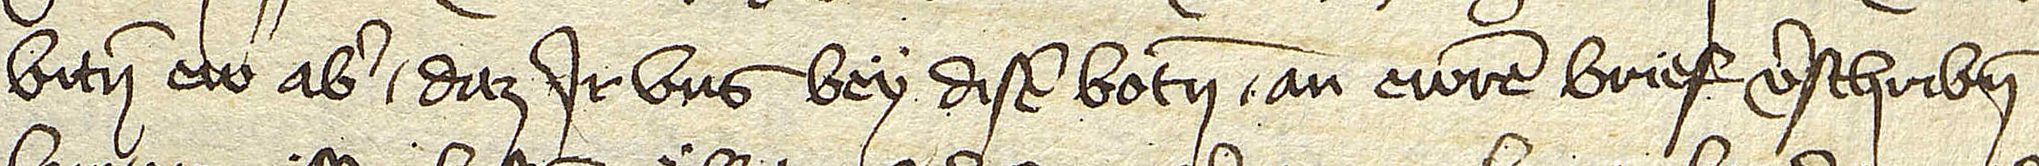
bitn* ew ab* / daʒ Ir vns bey diſe* botn* / an ewre* brief v*ſchribn*
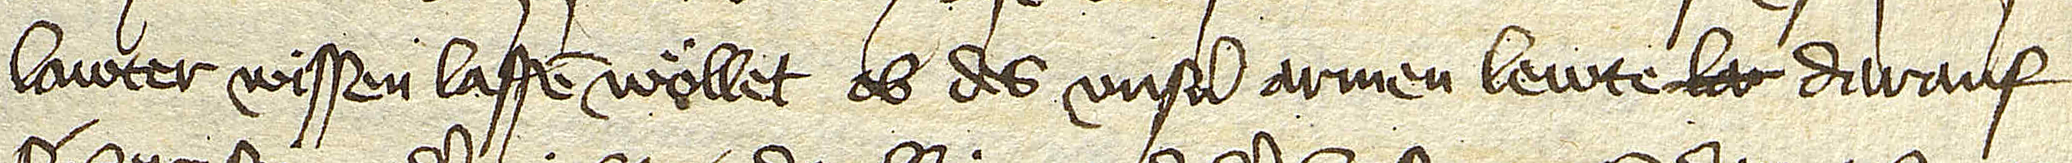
lawter wiſſen laſſe* wöllet ob des vnſn* armen lewte la darauf
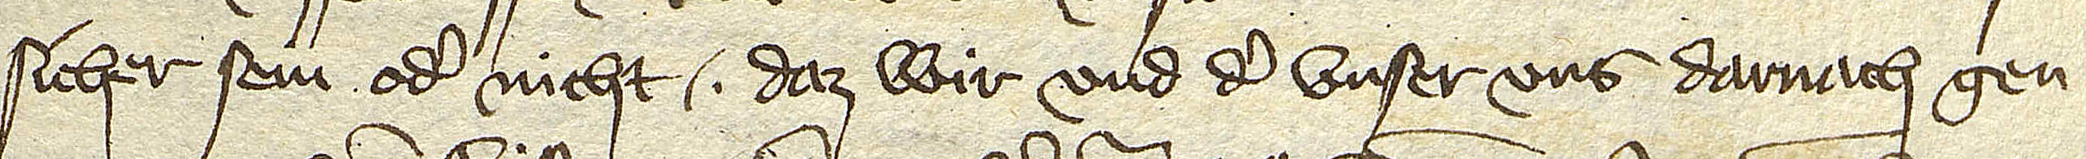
ſicher ſein od* nicht / . daʒ wir vnd d* vnſer vns darnach gen
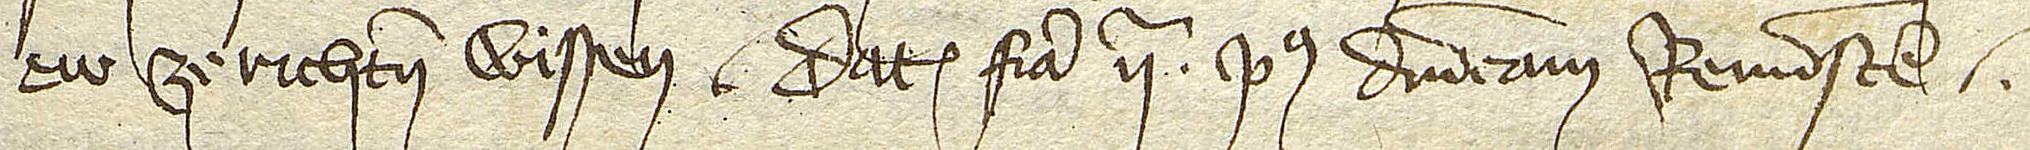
ew cʒe richtn* wiſſen / Dat* fia* ii* . p* dnicam* Reimſce* / .
